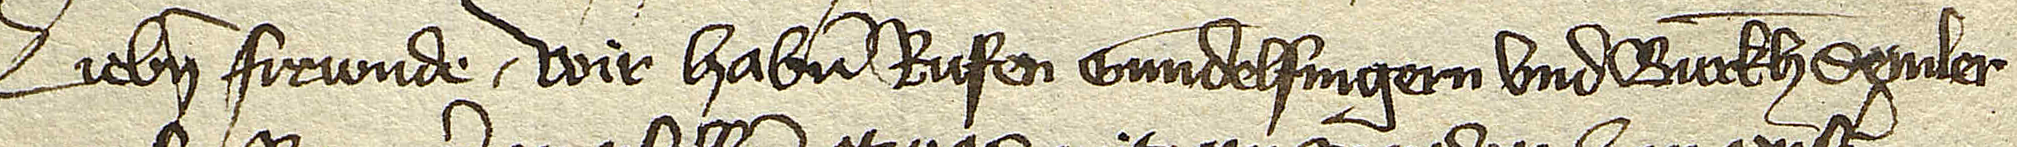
Liebn* frewnde / Wir habn* Rufen Gundelfingern vnd Burkh* Semler
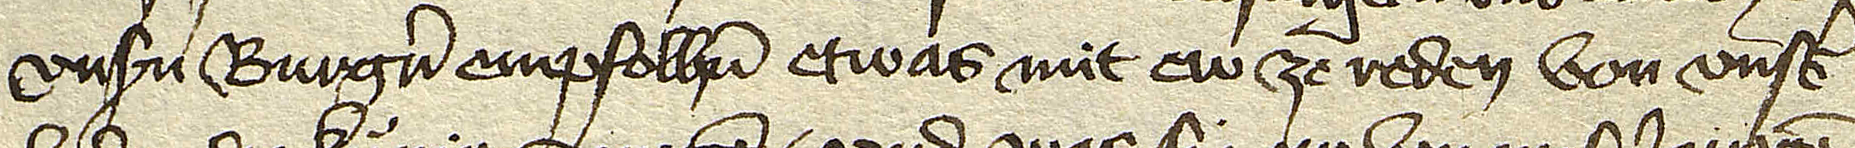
vnſ*n Burgn* empfolhn* etwas mit ew cʒe reden von vnſs*
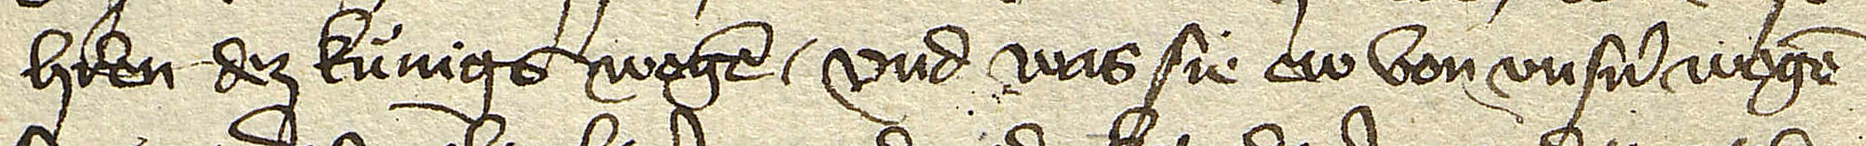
hr*en deʒ künigs wege* / vnd was ſie ew von vnſn* wege*
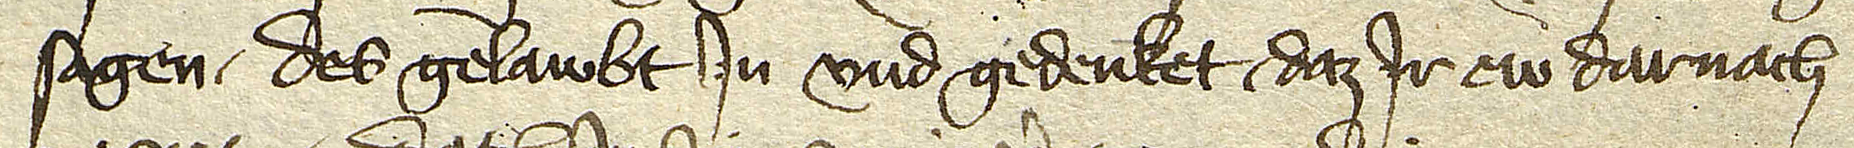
ſagen / des gelawbt In vnd gedenket / daʒ Ir ew darnach
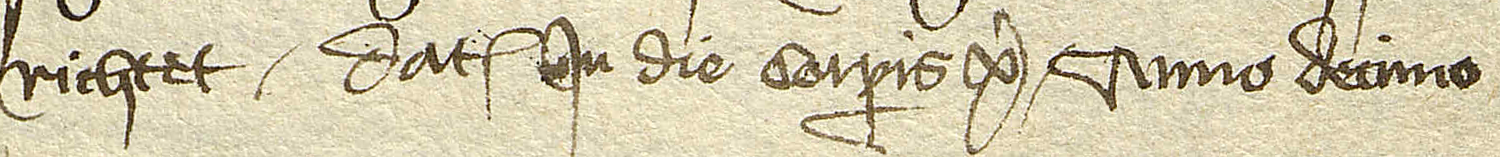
richtet / Dat* In die Corp*is x* / Anno decimo
